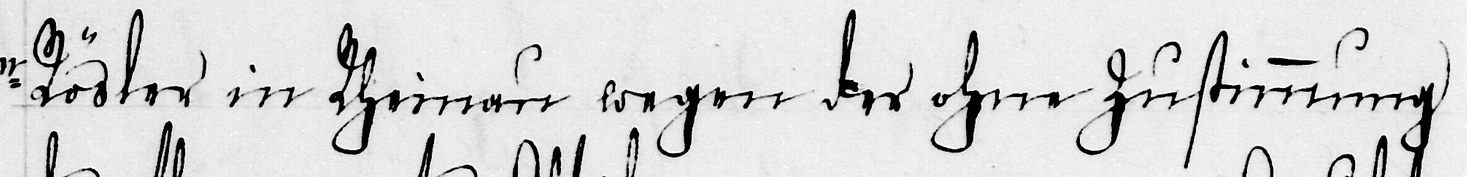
Rösler in Rheinau wegen der ohne Zustimmung
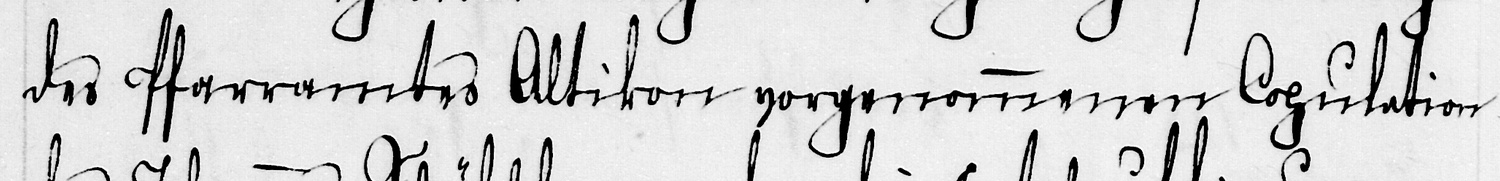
des Pfarramtes Altikon vorgenommenen Copulation
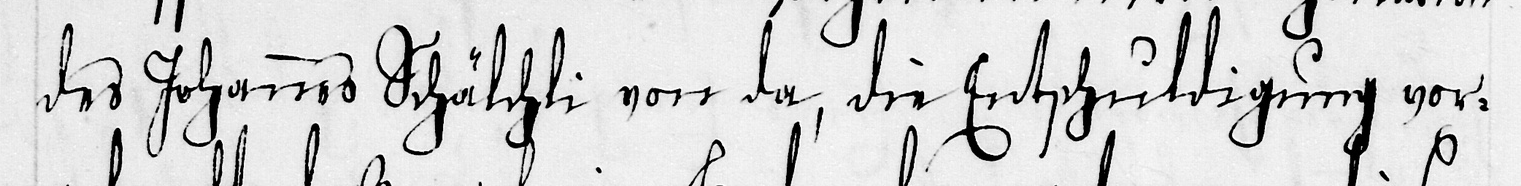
des Johannes Schälchli von da, die Entschuldigung vor¬
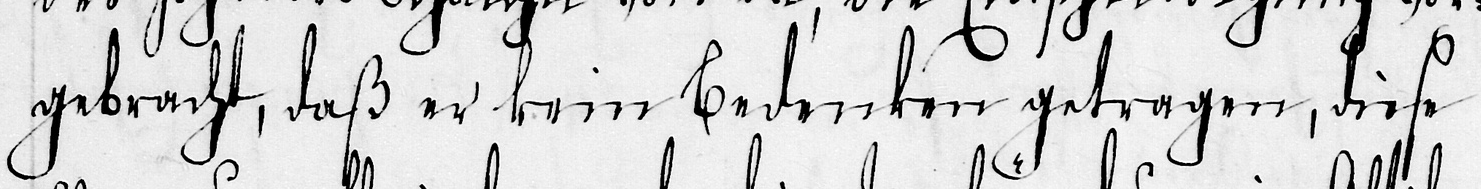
gebracht, daß er kein Bedenken getragen, diese
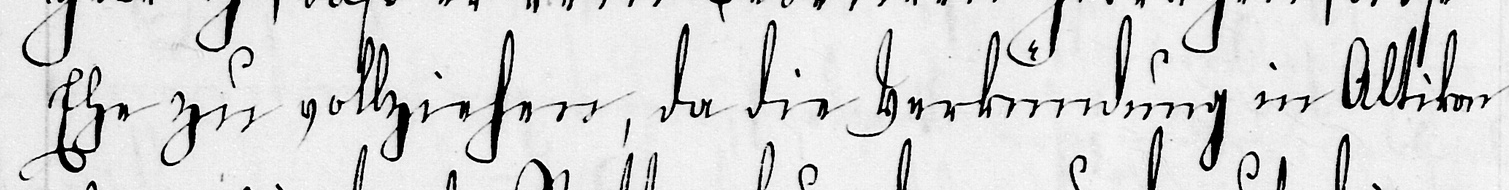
Ehe zu vollziehen, da die Verkündung in Altikon
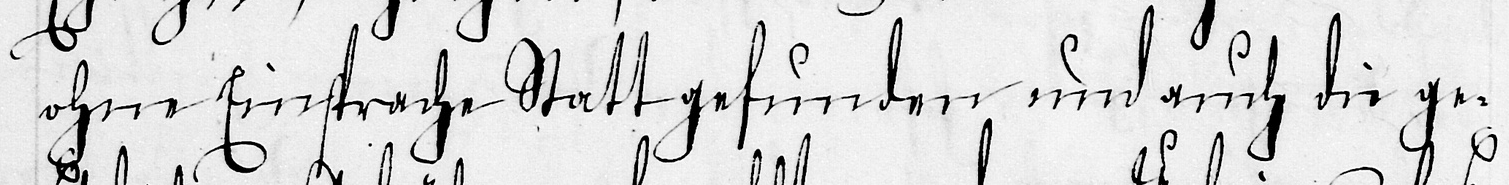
ohne Einsprache Statt gefunden und auch die ge¬
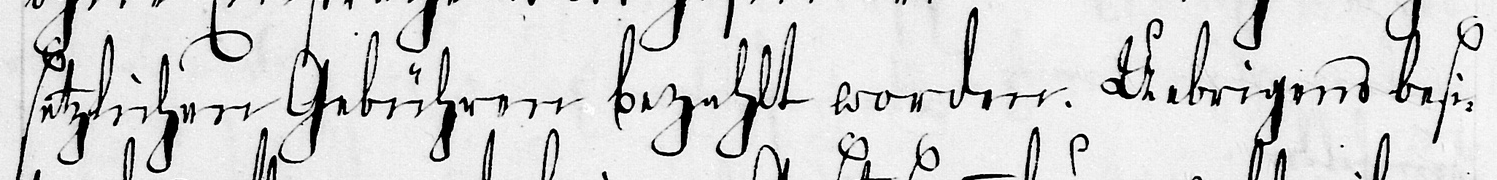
setzlichen Gebühren bezahlt worden. Uebrigens besi¬
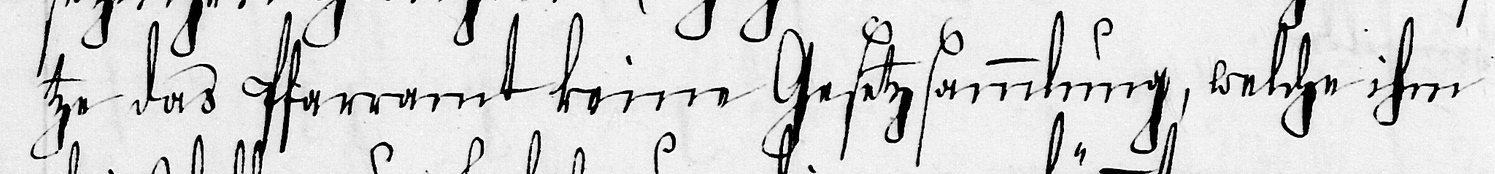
tze das Pfarramt keine Gesetzsammlung, welche ihm
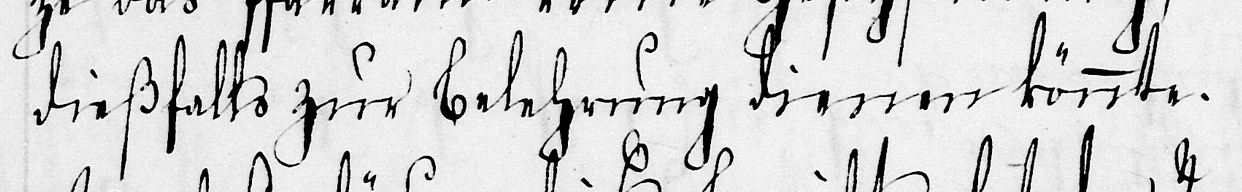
dießfalls zur Belehrung dienen könnte.
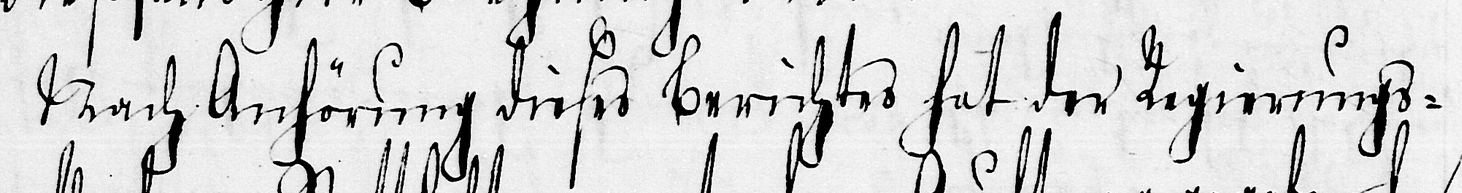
Nach Anhörung dieses Berichtes hat der Regierungs¬
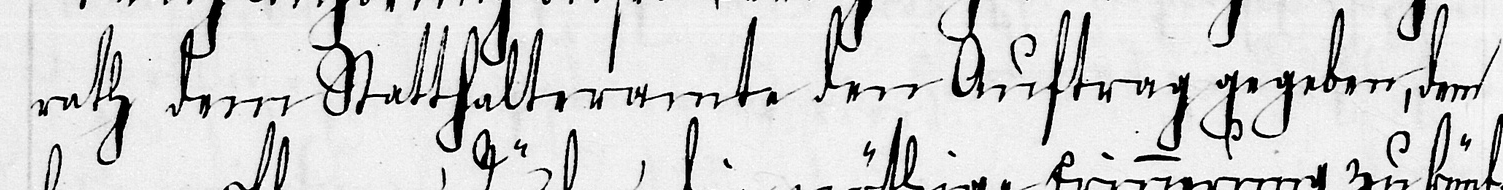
rath dem Statthalteramte den Auftrag gegeben, dem
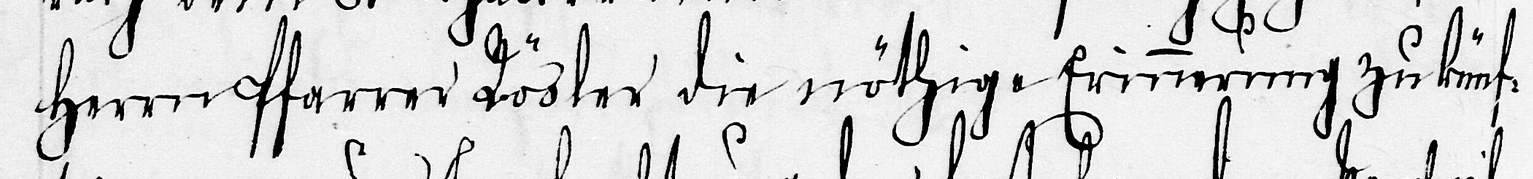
Herrn Pfarrer Rösler die nöthige Erinnerung zu künf¬
